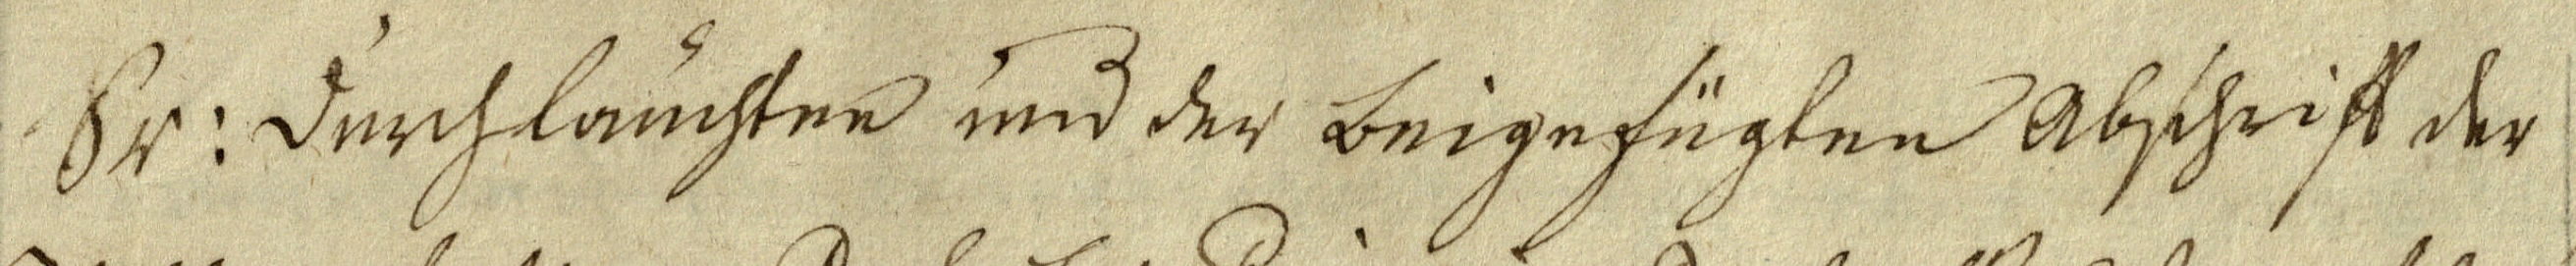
Sr: Durchlauchten und der beigefügten Abschrift der
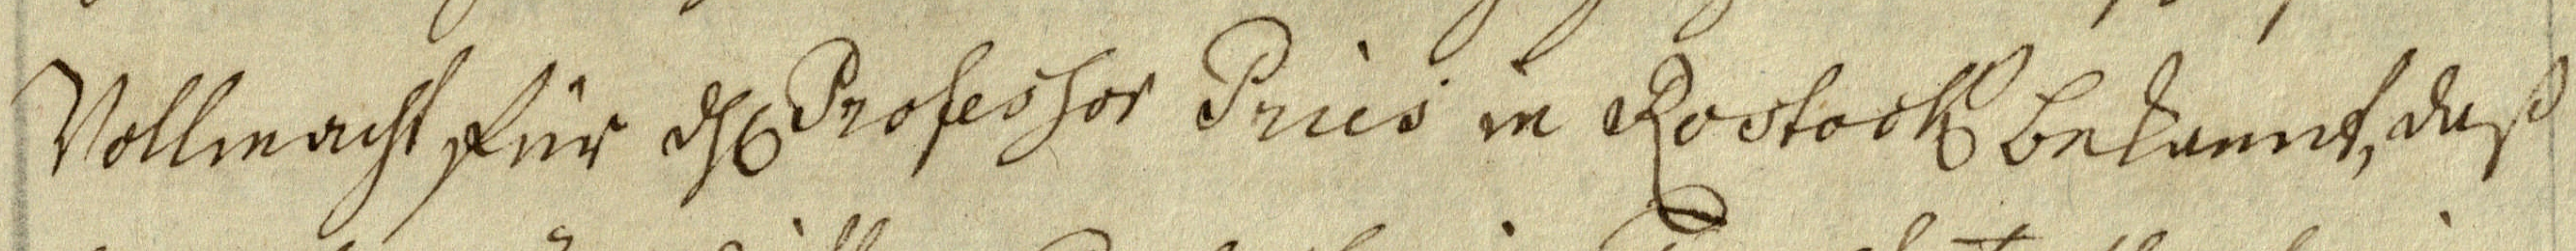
Vollmacht für dh Professor Pries in Rostock bekannt, daß
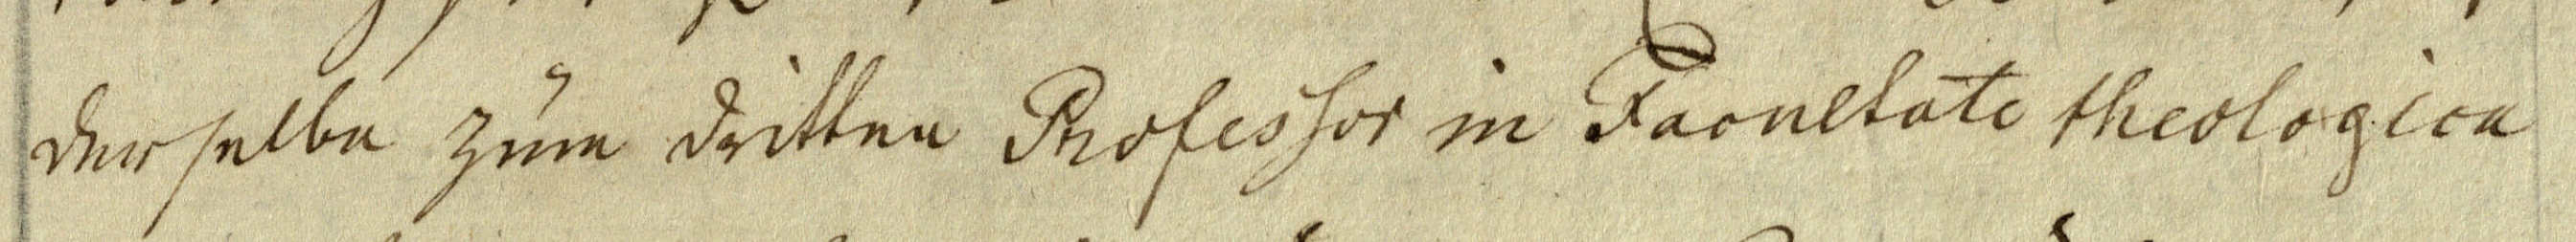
derselbe zum dritten Professor in Facultate theologica
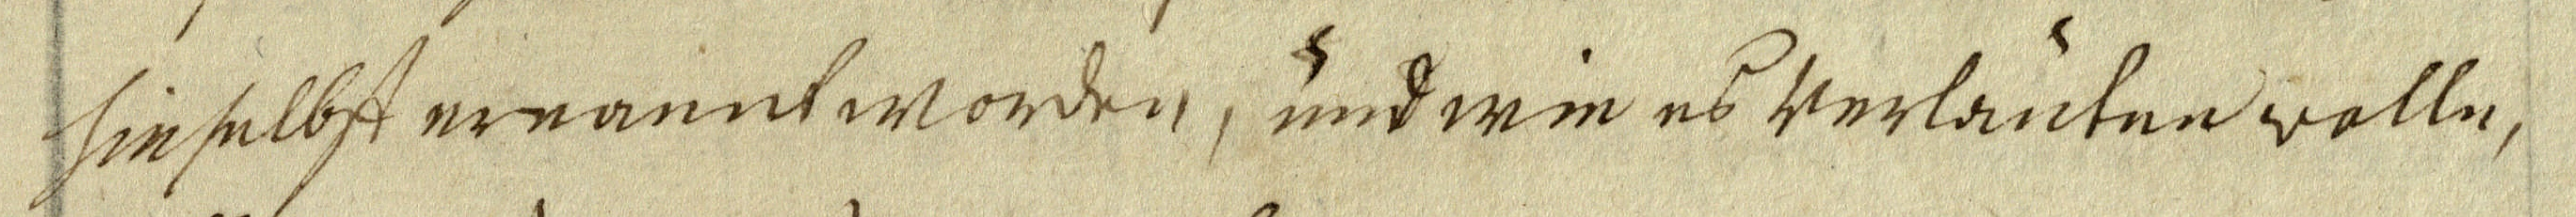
hieselbst ernannt worden, und wie es verlauten wolle,
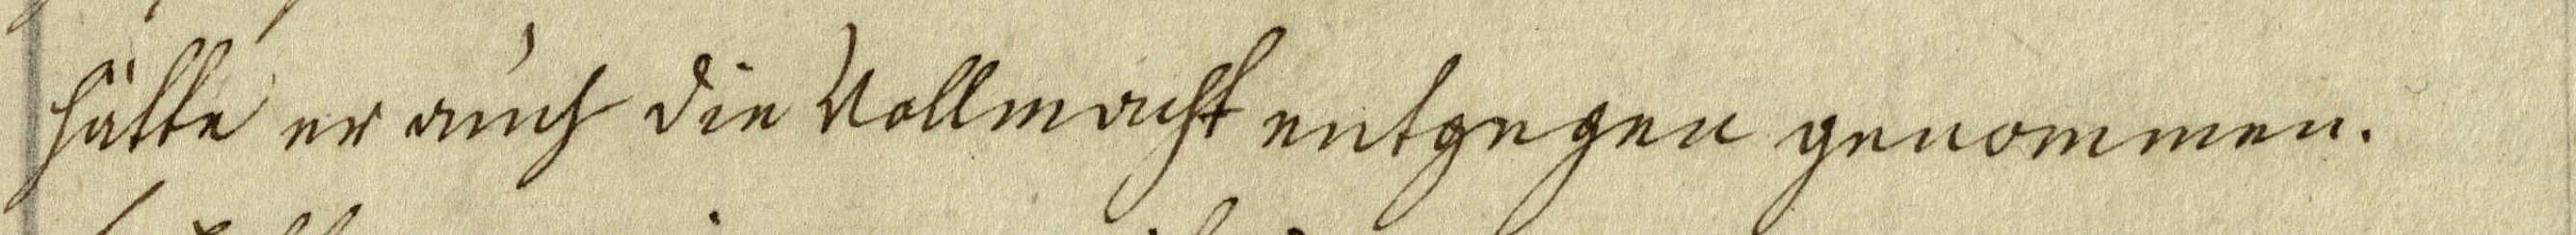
hätte er auch die Vollmacht entgegen genommen.
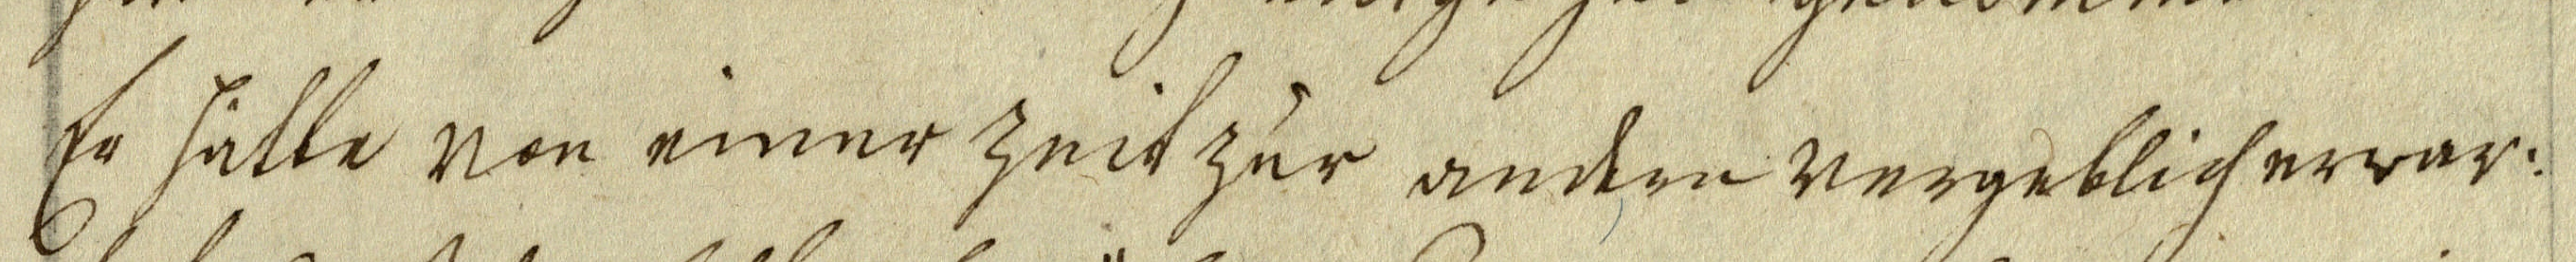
Er hätte von einer Zeit zur anderen vergeblich erwar¬
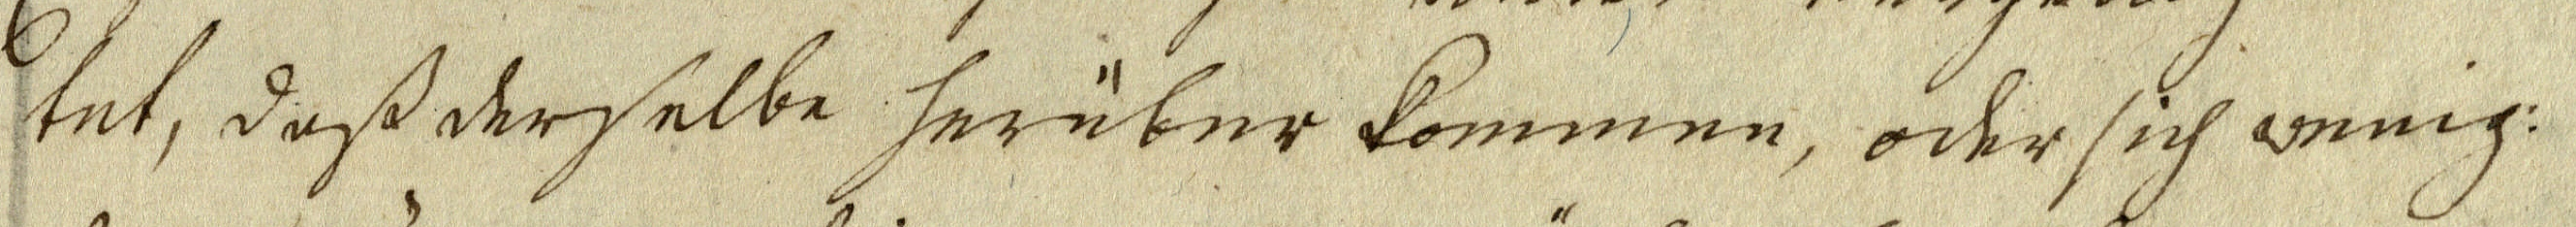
tet, daß derselbe herüber kommen, oder sich wenig¬
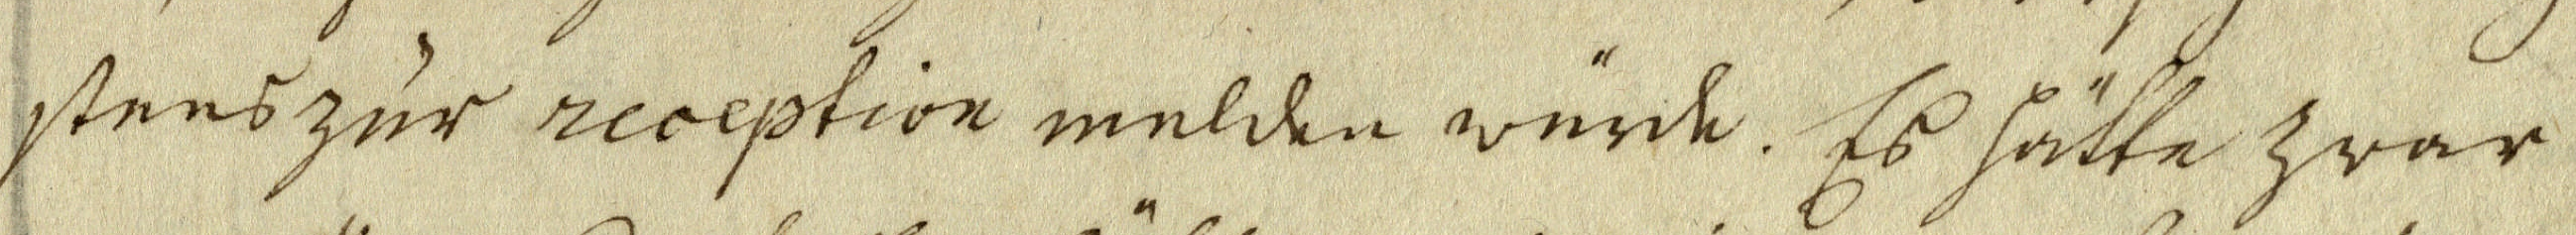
stens zur reception melden würde. Es hätte zwar
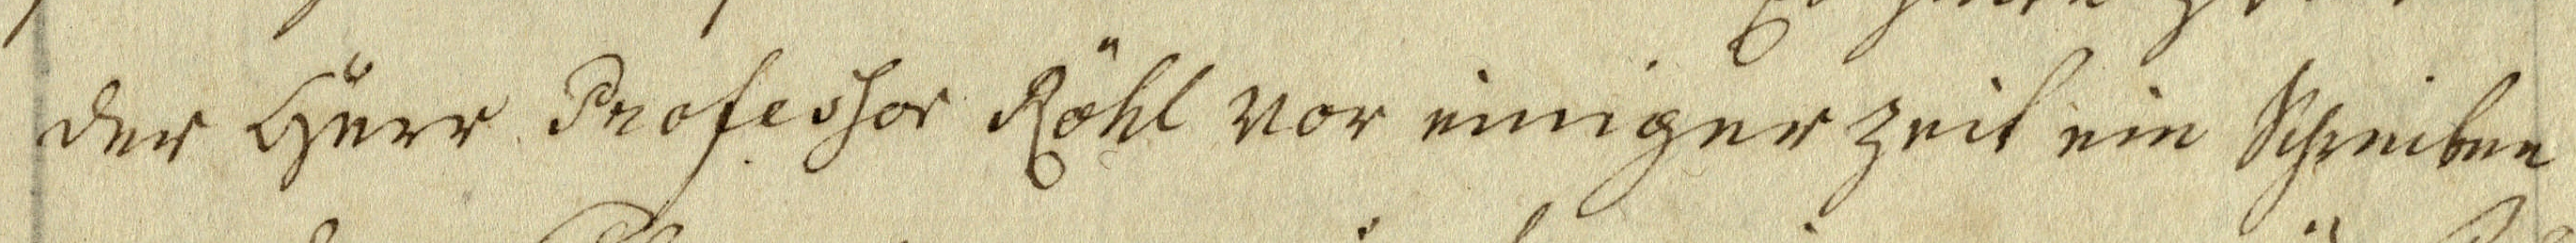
der Herr Professor Röhl vor einiger zeit ein Schreiben
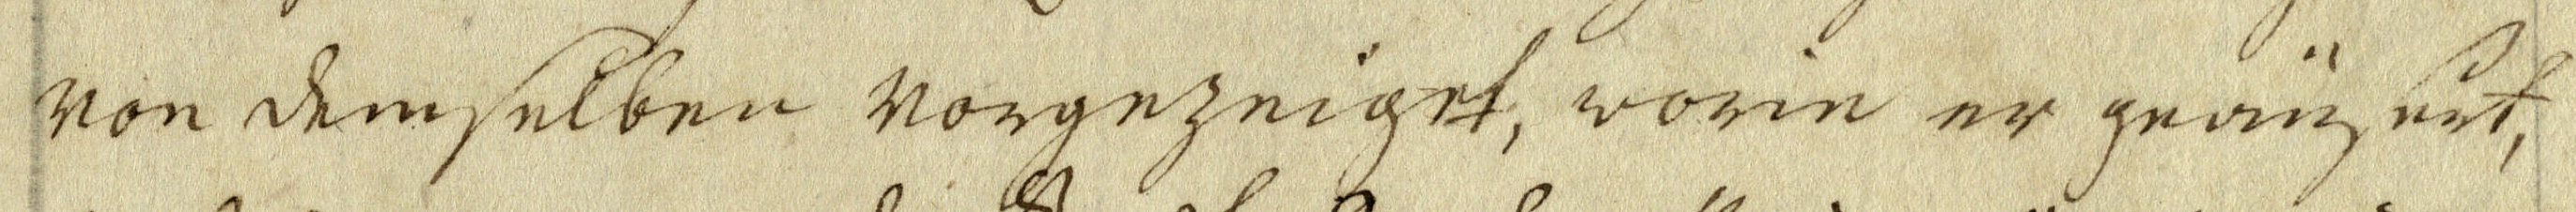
von demselben vorgezeiget, worin er geäußert,
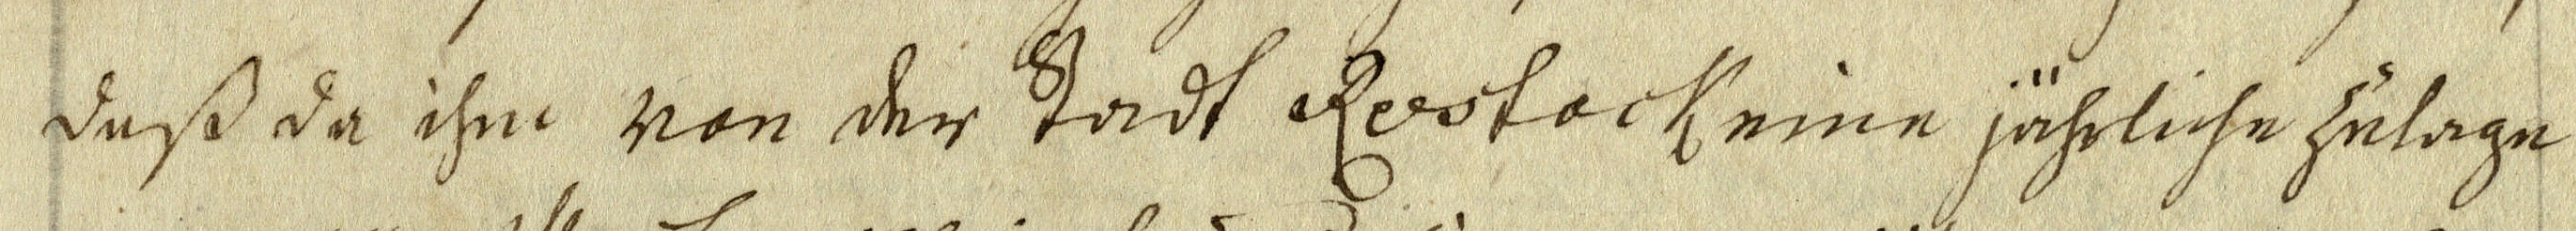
daß da ihm von der Stadt Rostock eine jährliche Zulage
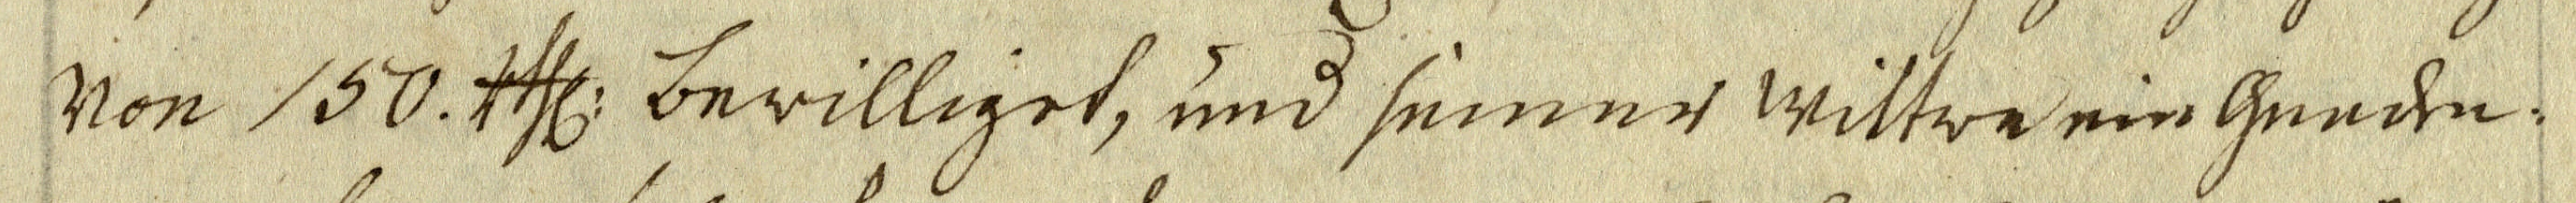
von 150. r: bewilliget, und seiner Wittwe ein Gnaden¬
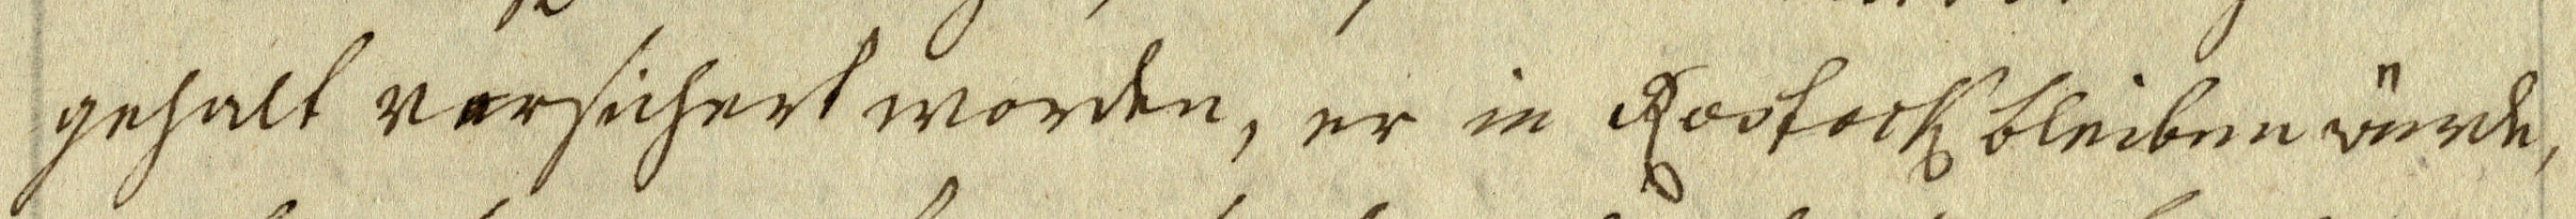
gehalt versichert worden, er in Rostock bleiben würde,
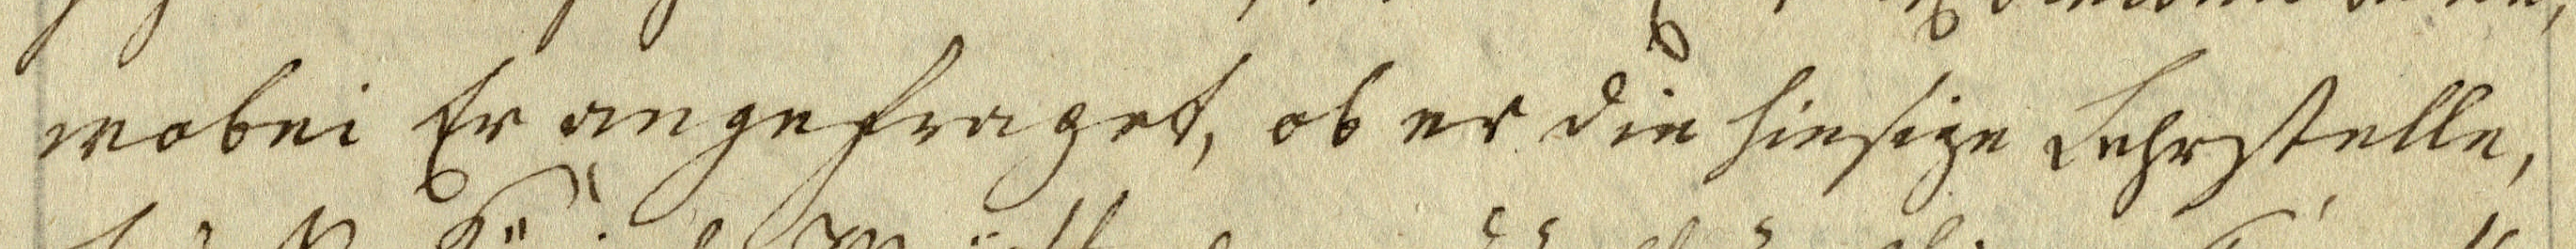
wobei Er angefraget, ob er die hiesige Lehrstelle,
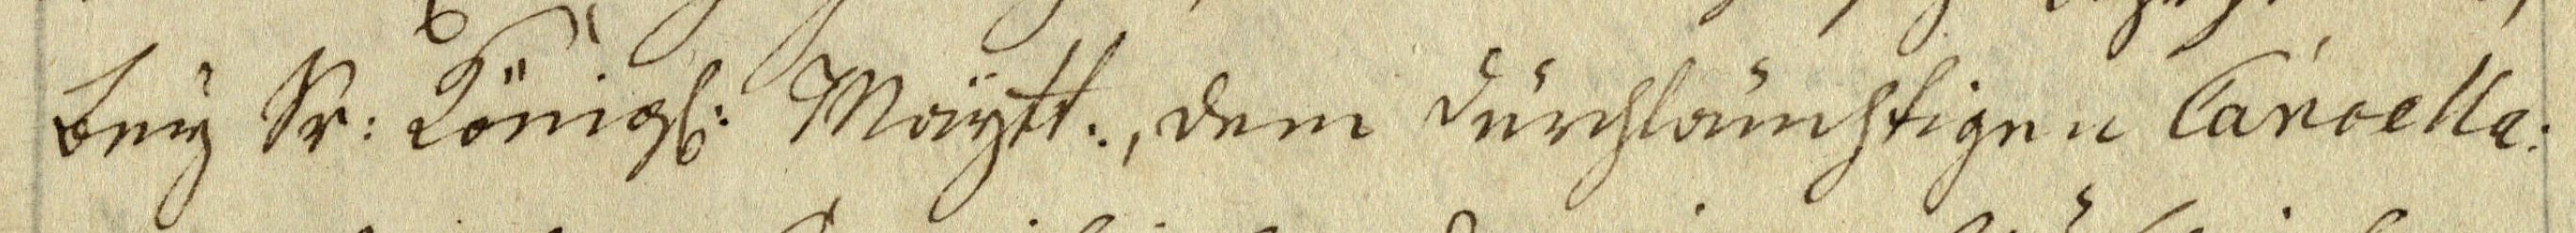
beÿ Sr: Königl: Maÿtt., dem durchlauchtigen Cancella¬
